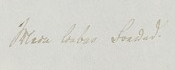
Mein lieber Freund.
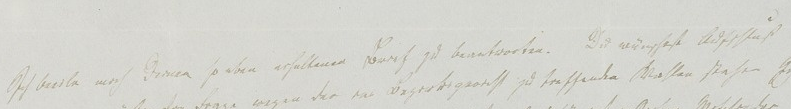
Ich beeile mich Deinen so eben erhaltenen Brief zu beantworten. Du wünschest Aufschluß
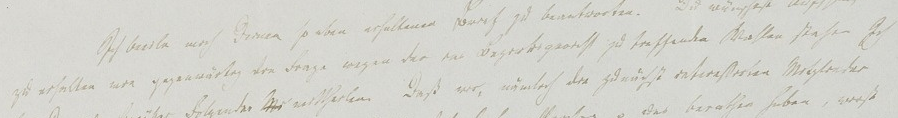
zu erhalten wie gegenwärtig die Frage wegen der ins Bezirksgericht zu treffenden Wahlen stehe. Ich
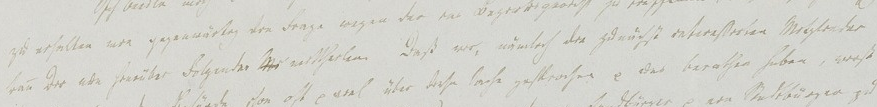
kann Dir nun hierüber Folgendes Mi mittheilen. Daß wir, nämlich die zunächst interessirten Mitglieder
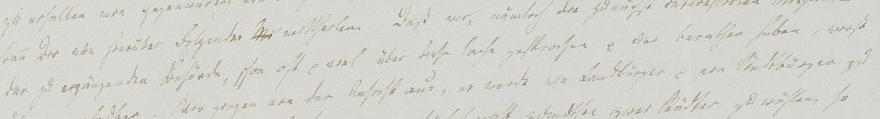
der zu ergänzenden Behörde, schon oft & viel über diese Sache gesprochen & uns berathen haben, wirst
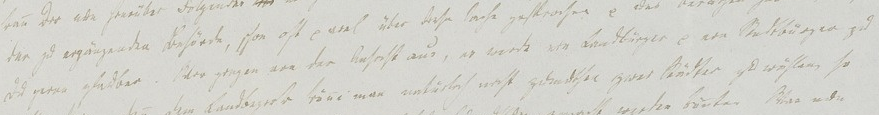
Du gerne glauben. Wir gingen von der Ansicht aus, es werde ein Landbürger & ein Stadtbürger zu
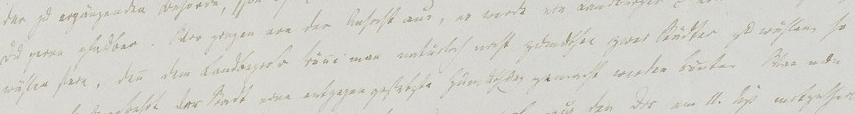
wählen sein, denn dem Landbezirk könne man natürlich nicht zumuthen zwei Städter zu wählen so
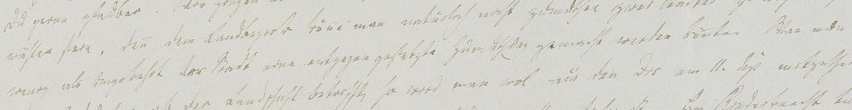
wenig als umgekehrt der Stadt eine entgegengesetzte Zumuthung gemacht werden könnte. Was nun
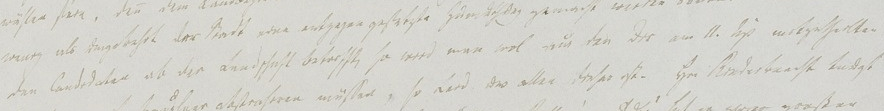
den Candidaten ab der Landschaft betrifft, so wird man wol aus den Dir am 11. diß mitgetheilten
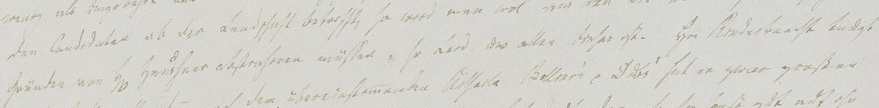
Gründen von Herrn Hausheer abstrahiren müssen, so Leid uns allen dieses ist. Hr. Rinderknecht taugt
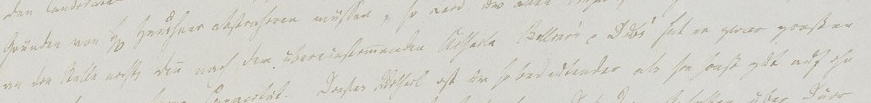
an die Stelle nichts, denn nach dem übereinstimmenden Urtheile Bollier's & Dubs' hat er zwar großen
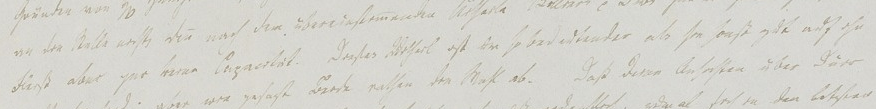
Fleiß aber gar keine Capacität. Dieses Urtheil ist um so bedeutender als sie sonst gut auf ihn
